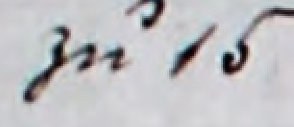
zu 15
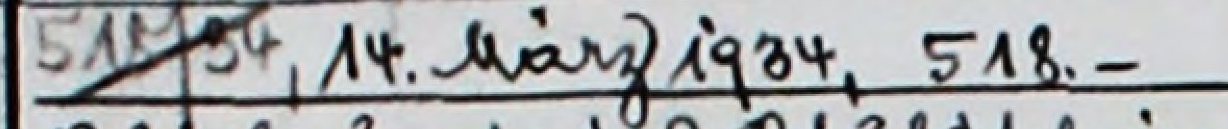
518/34, 14. März 1934, 518.-
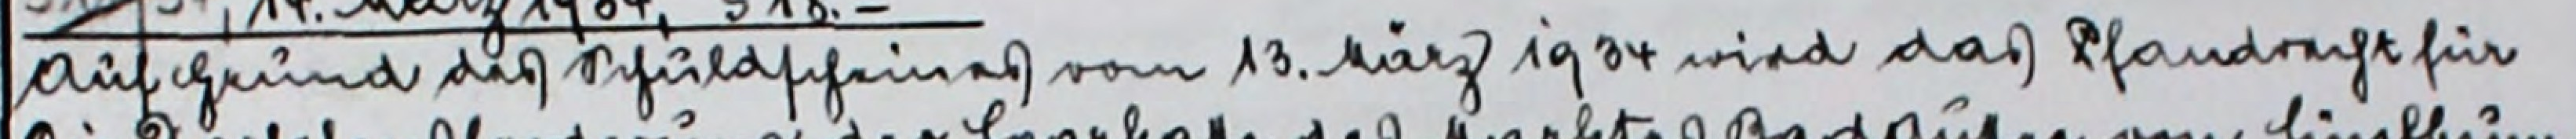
Auf Grund das Schuldscheines vom 13. März 1934 wird das Pfandrecht für
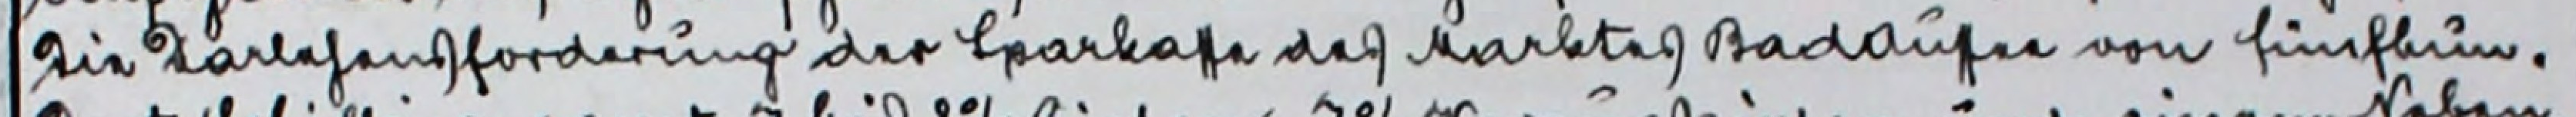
die Darlehensforderung der Sparkasse des Marktes Badaussee von fünfhun„
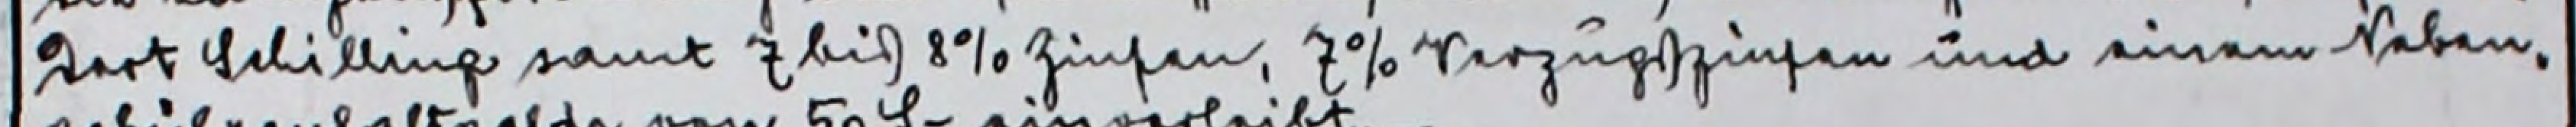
dert Schilling samt 7 bi 8 % Zinsen, 7 % Verzugszinsen und einem Neben„
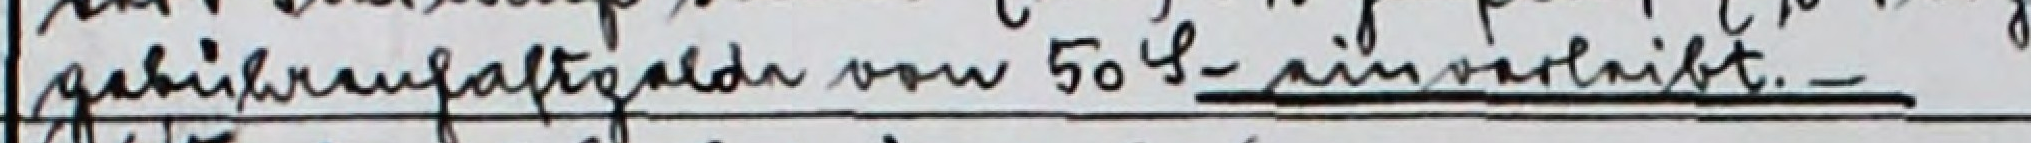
gebührenhaftgelde von 50 S - einverleibt.-
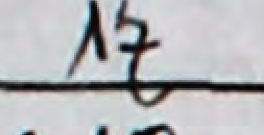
17
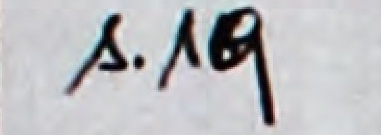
s. 19
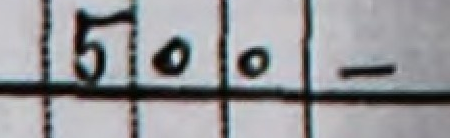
500 –
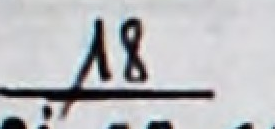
18
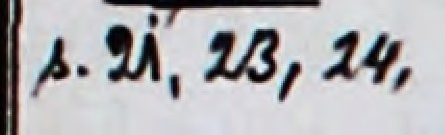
s. 21, 23, 24,
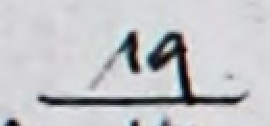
19
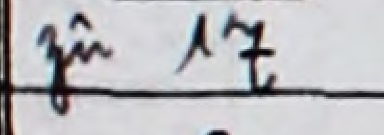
zu 17
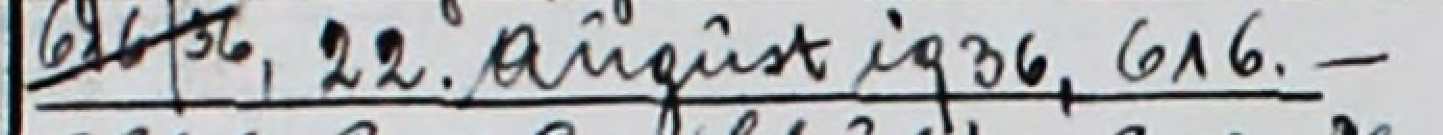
616/36, 22. August 1936, 616.-
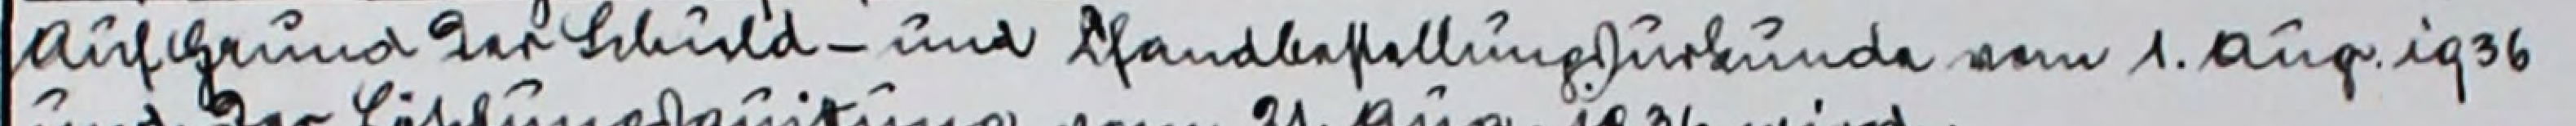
Auf Grund der Schuld- und Pfandbestellungsurkunde vom 1. Aug. 1936
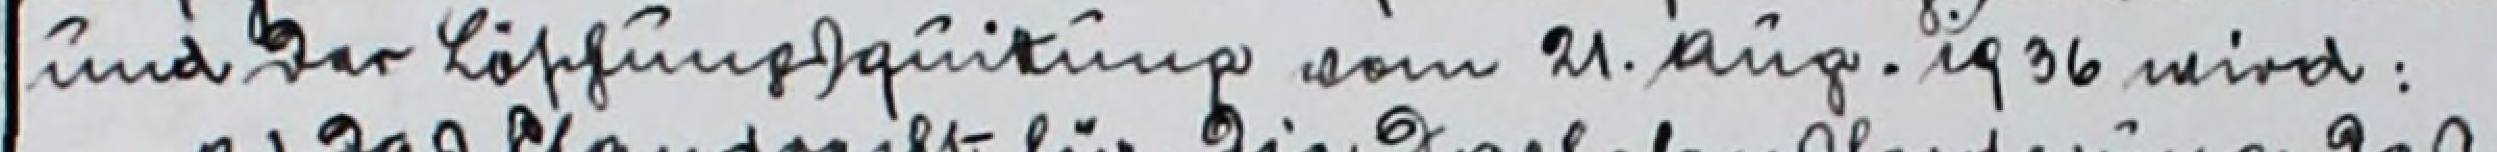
und der Löschungsquittung vom 21. Aug. 1936 wird:
